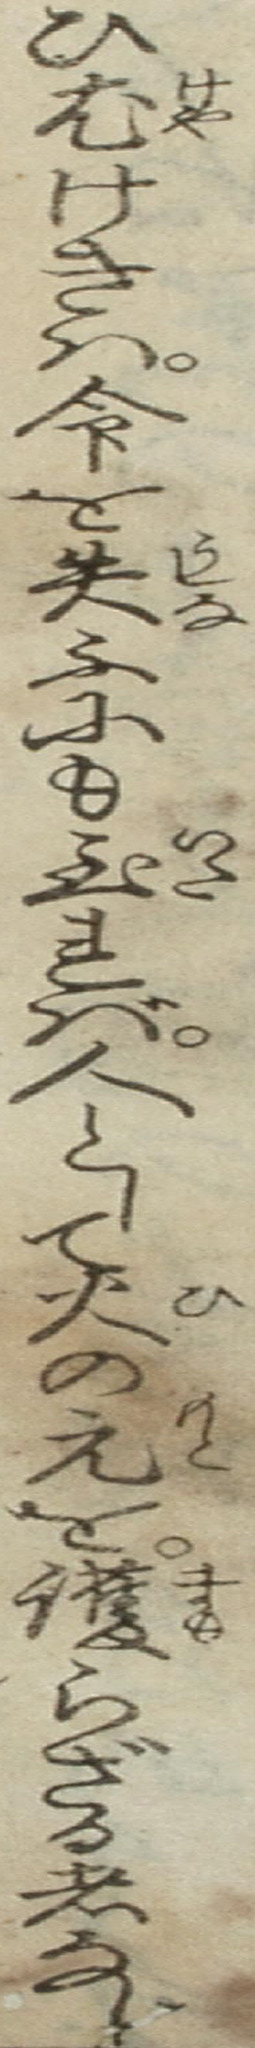ひ尤けきは。命を失ふにも至れば。人として火の元を。護らざる者なし
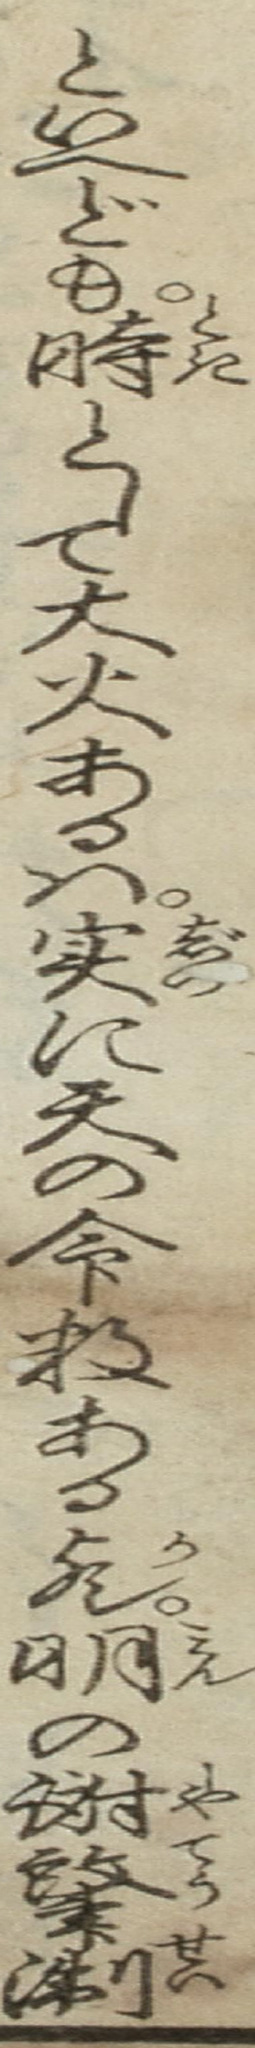といへども。時として大火あるは。実に天の命数ある歟。明の謝肇淛
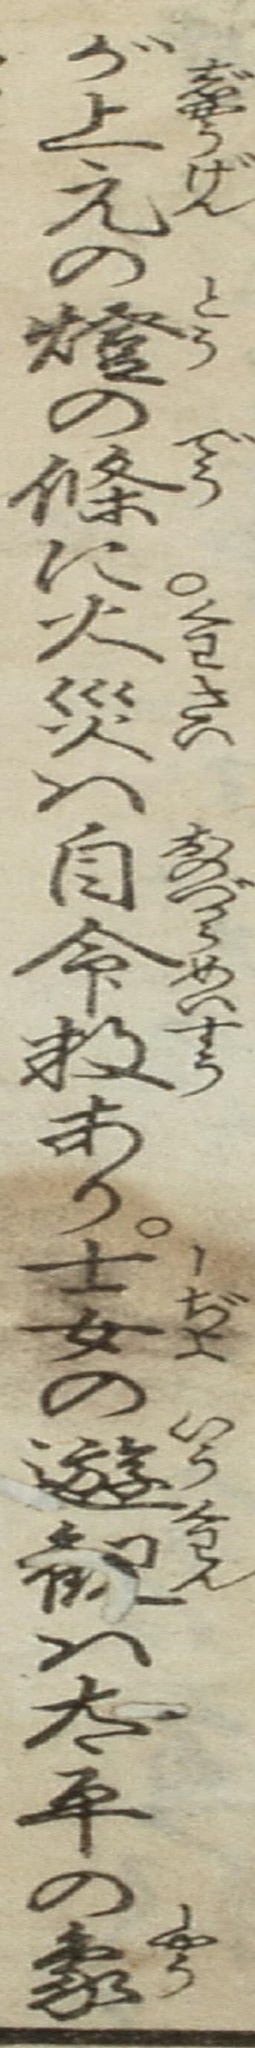が上元の燈の条に。火災は自命数あり。士女の遊観は太平の象
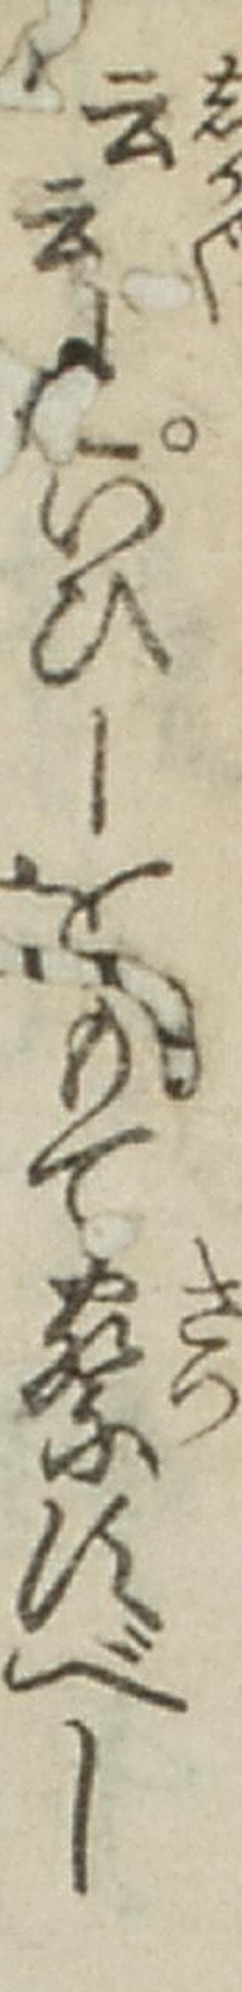云云と。いひしをもて察すべし
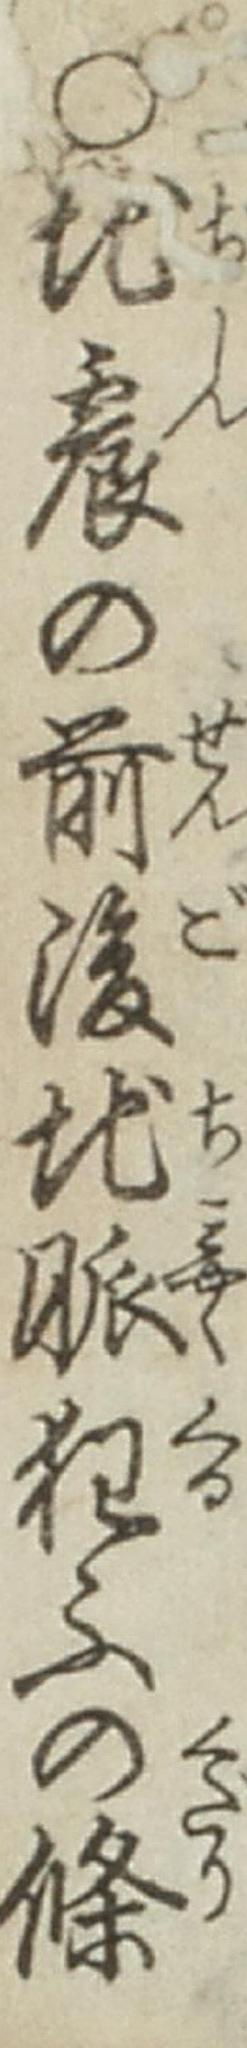○地震の前後地脈狂ふの条
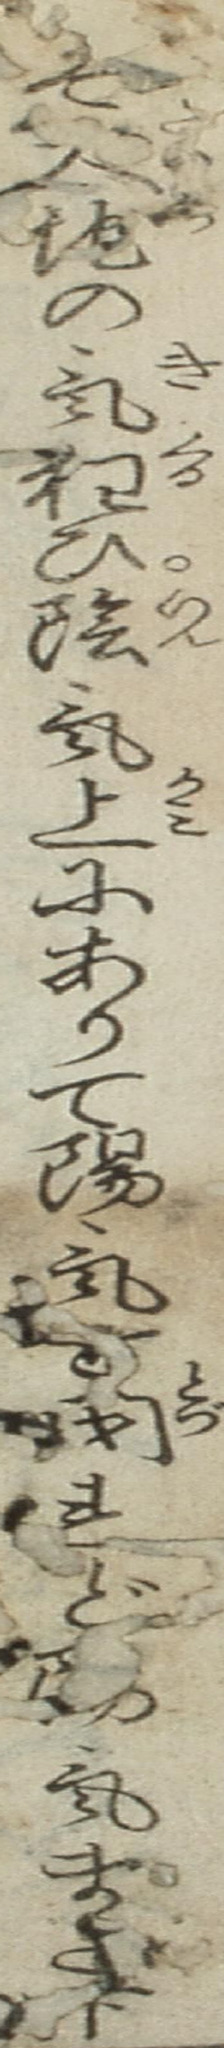およそ大地の気狂ひ。陰気上にありて陽気を閉れど陽気また下
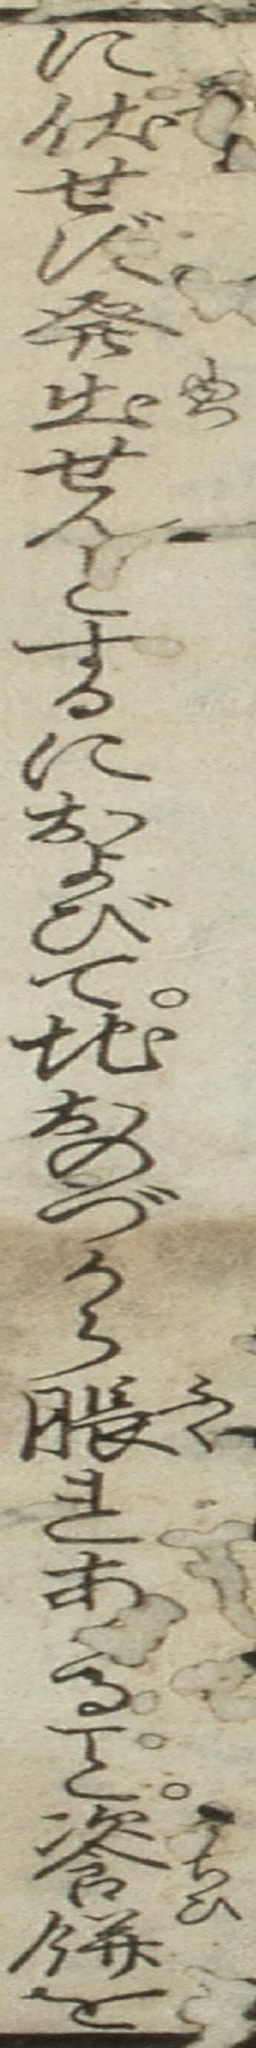に伏せず発出せんとするにおよびて。地おのづから脹れあがること。養餅を
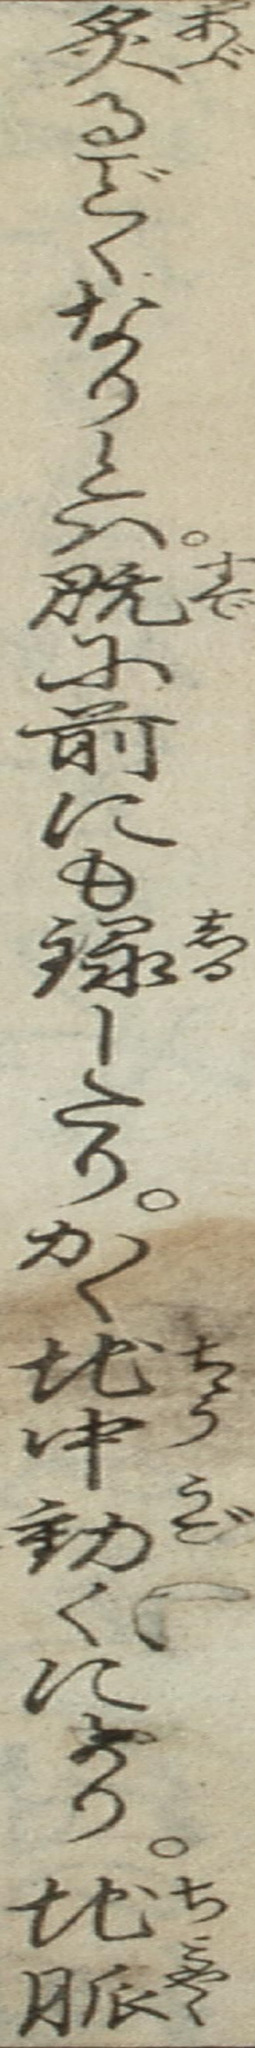炙るごとくなりとは。既に前にも録したり。かく地中動くにより。地脈
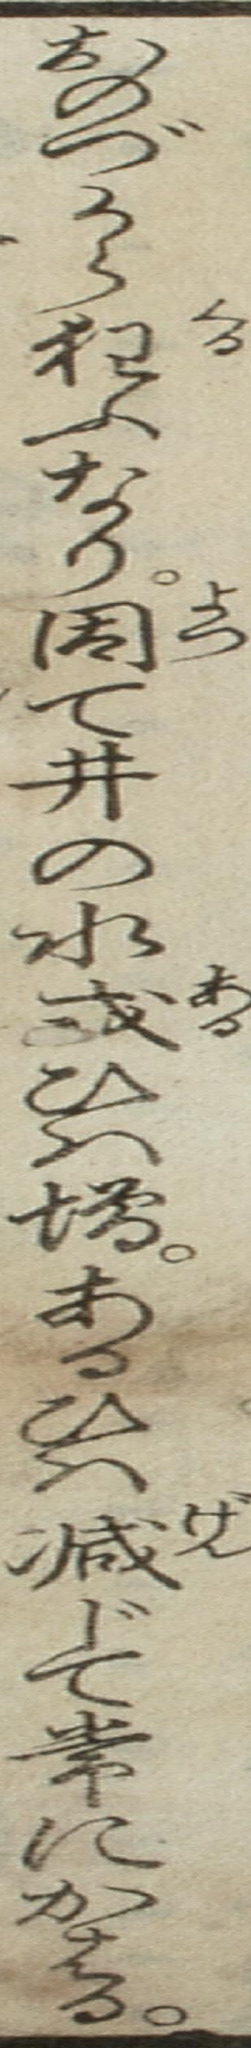おのづから狂ふなり。因て井の水或ひは増。あるひは減じて常にかはる。
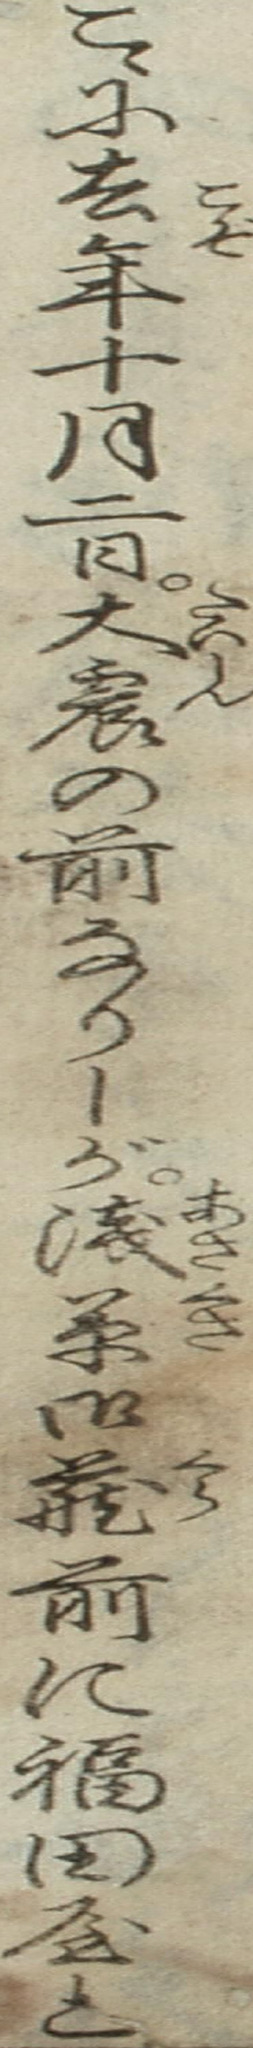こゝに去年十月二日。大震の前なりしが。浅草御蔵前に福田屋と
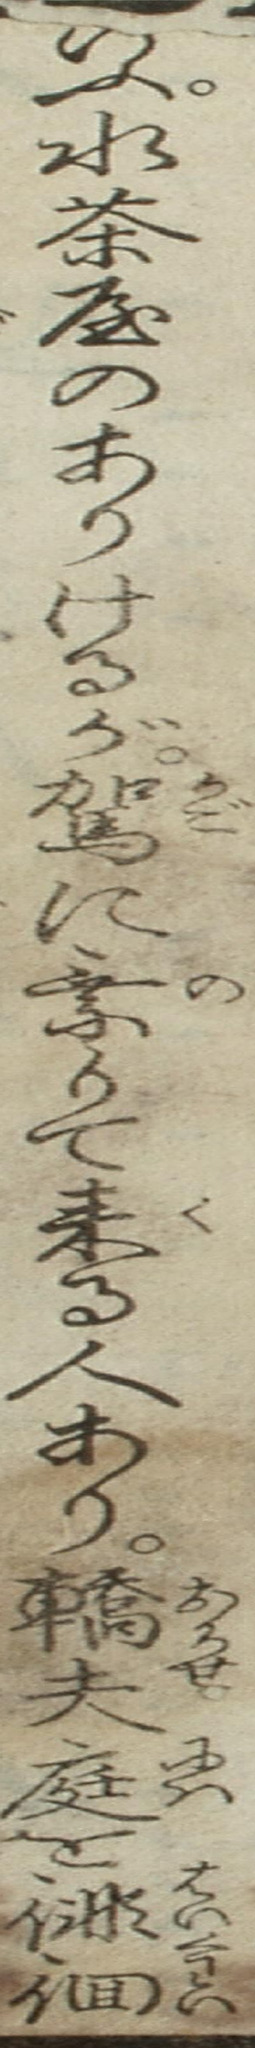いふ。水茶屋のありけるが。駕に乗りて来る人あり。轎夫庭を徘徊
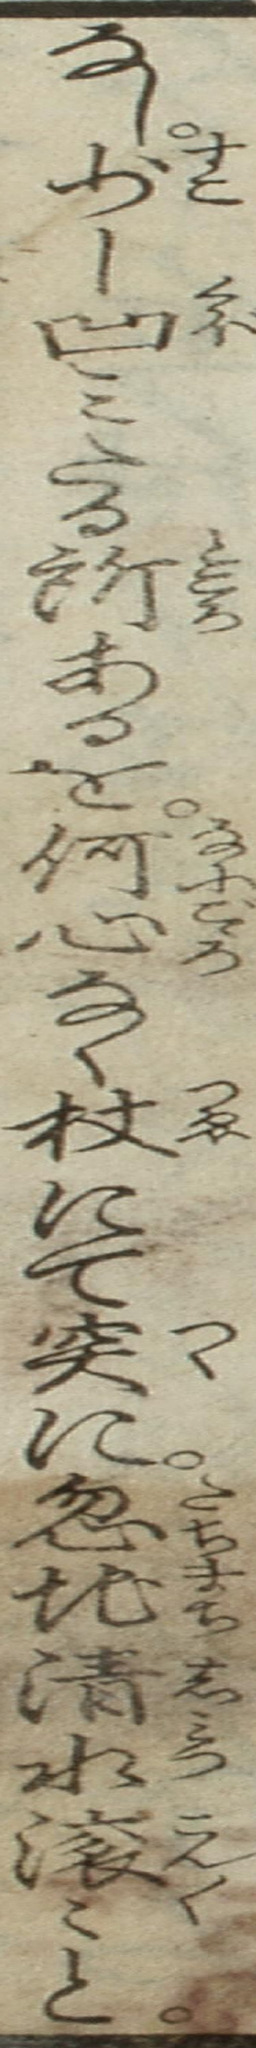なし。少し凹みたる所あるを。何心なく杖にて突に。忽地清水滾〻と。
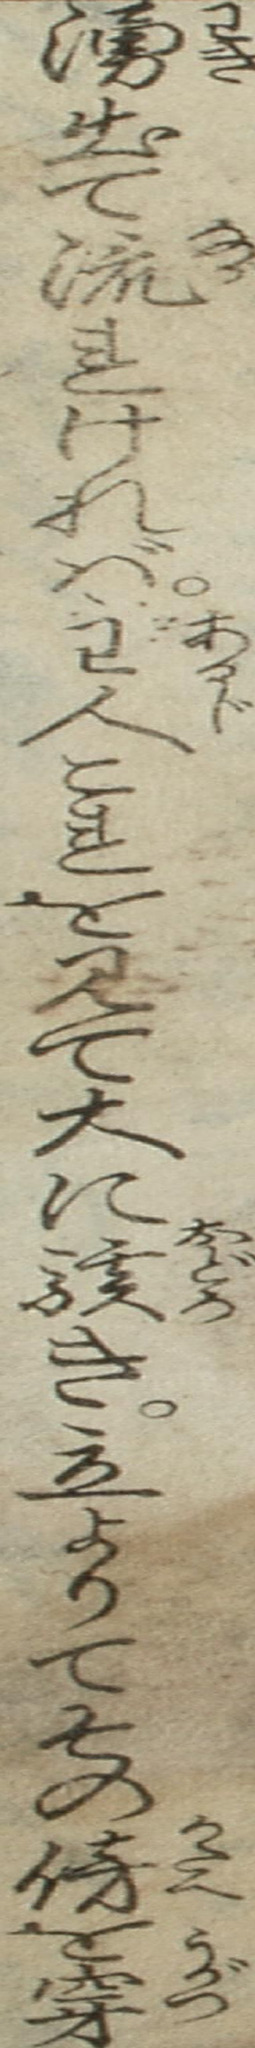湧出て流れければ。主人これを見て大に駭き。立よりてその傍を穿
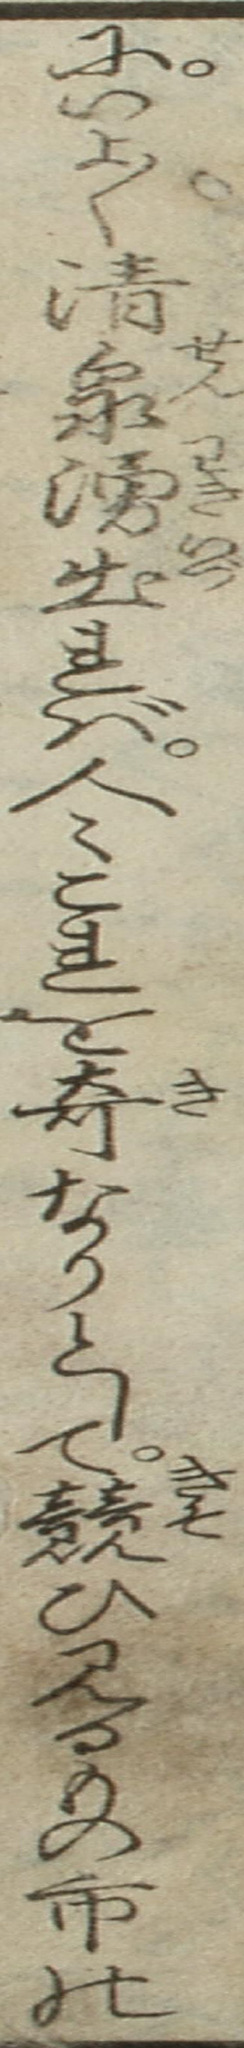に。いよ〳〵清泉湧出れば。人〻これを奇なりとして。競ひ見るもの市の
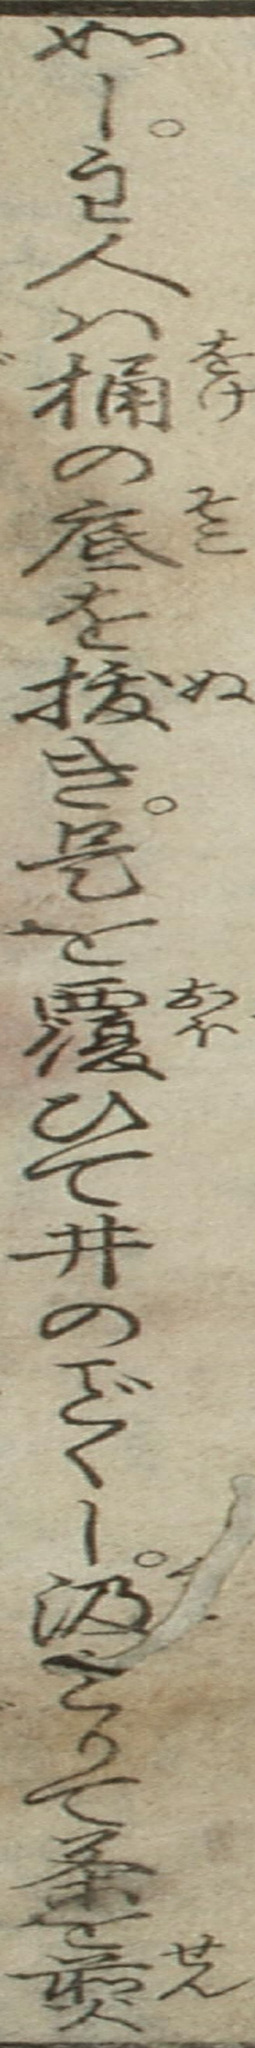如し。主人は桶の底を抜き。是を覆ひて井のごとくし。汲とりて茶を煎
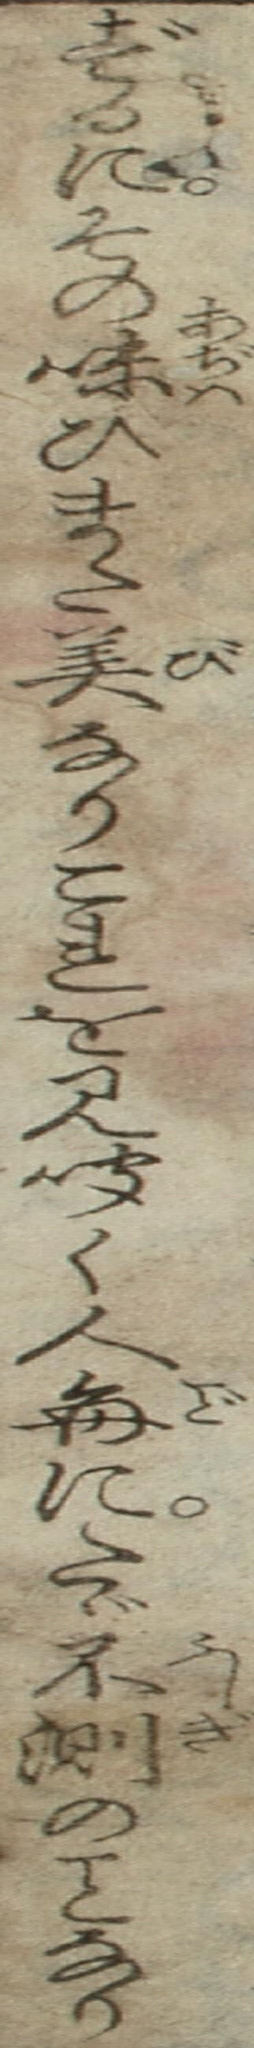ずるに。その味ひまた美なりこれを見聞く人毎に。たゞ不測のことなり
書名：安政見聞録　中
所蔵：東京大学地震研究所図書室 Earthquake Research Institute Library, The University of Tokyo, JAPAN
